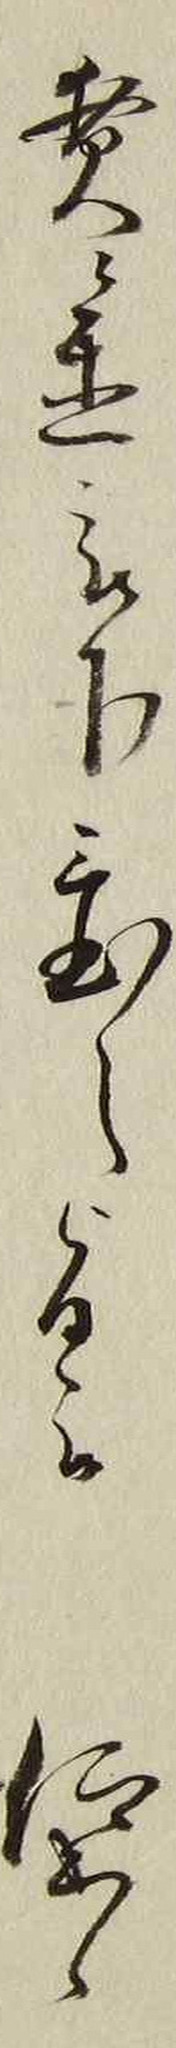費ニ置被下置候旨被仰出候
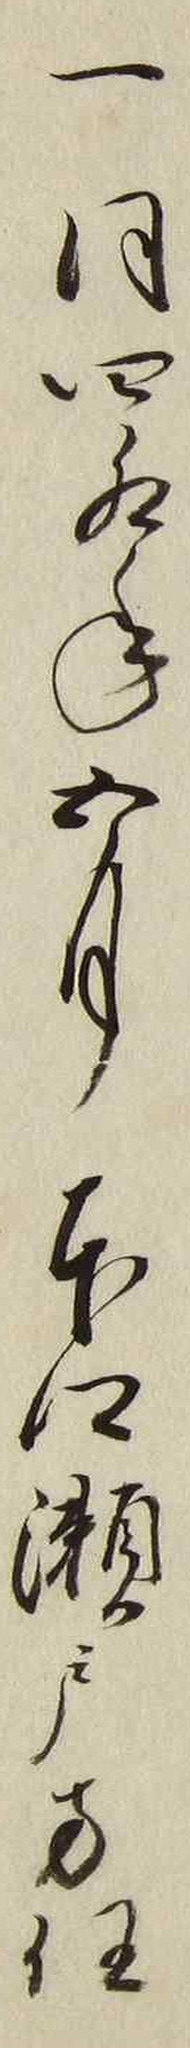一同四卯年五月本郷瀬戸方任

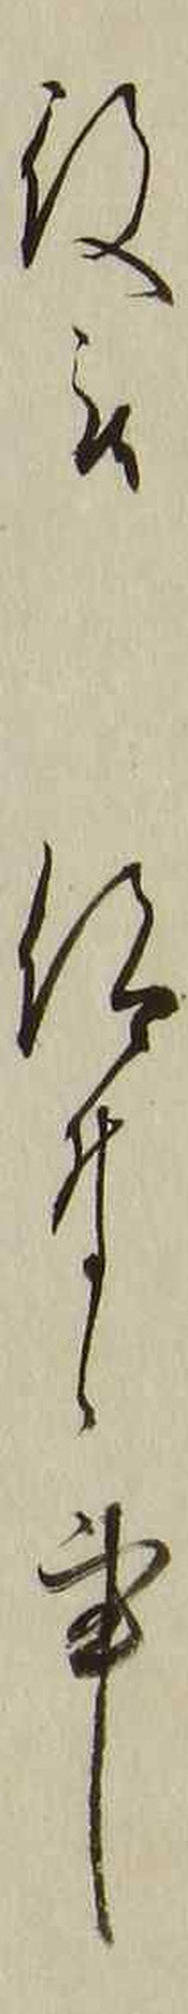役被仰付候事
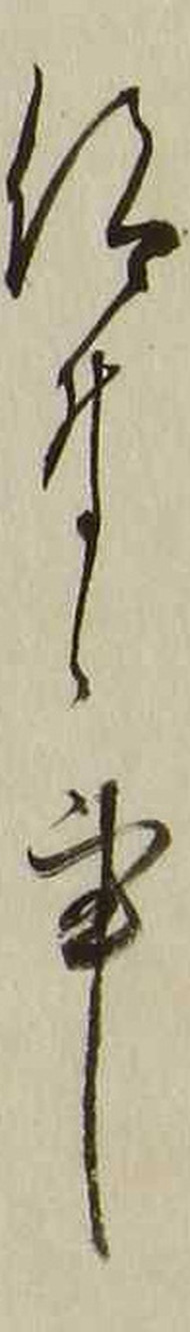仰付候事
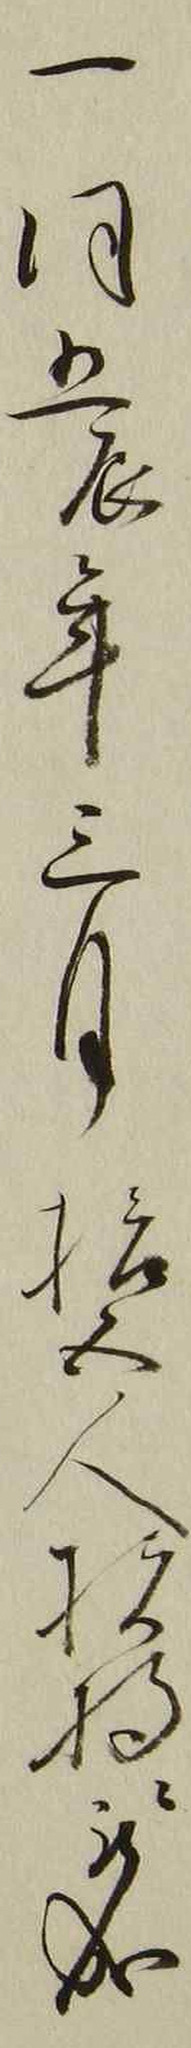一同五辰年三月拾五人扶持ニ被成
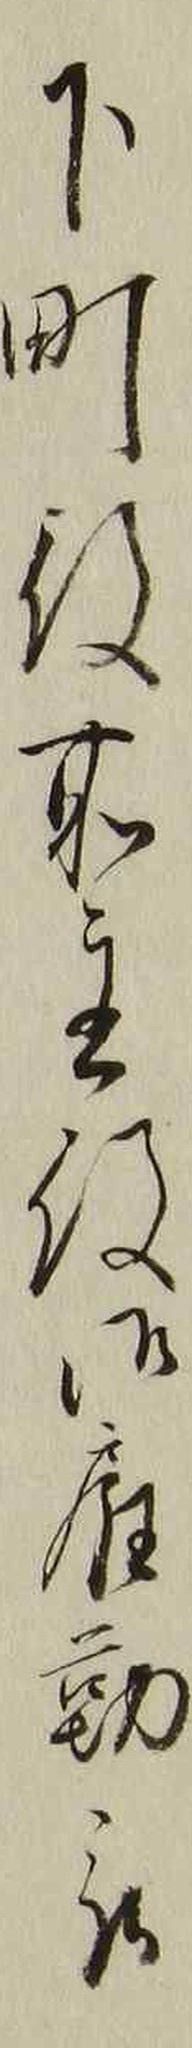下町役所主役御雇勤被
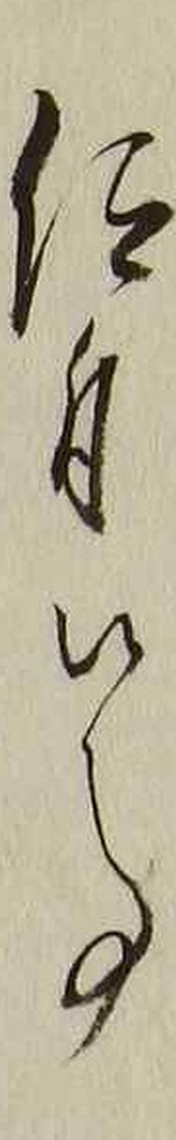仰付候事
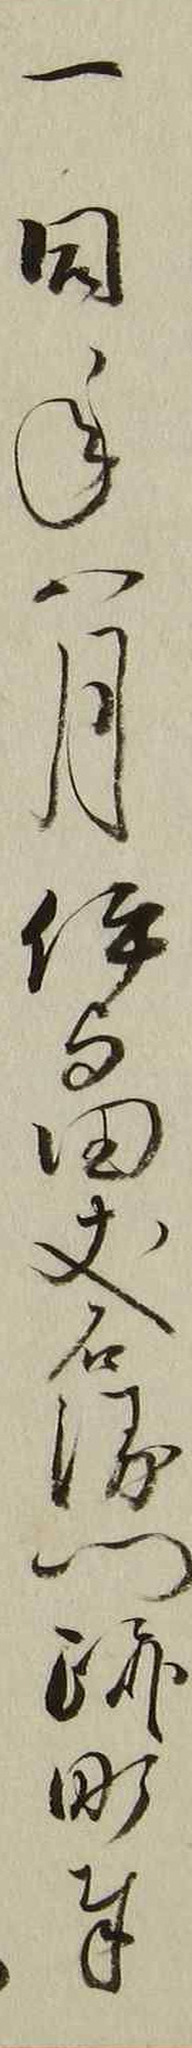一同年八月伊与田丈右衛門跡町奉
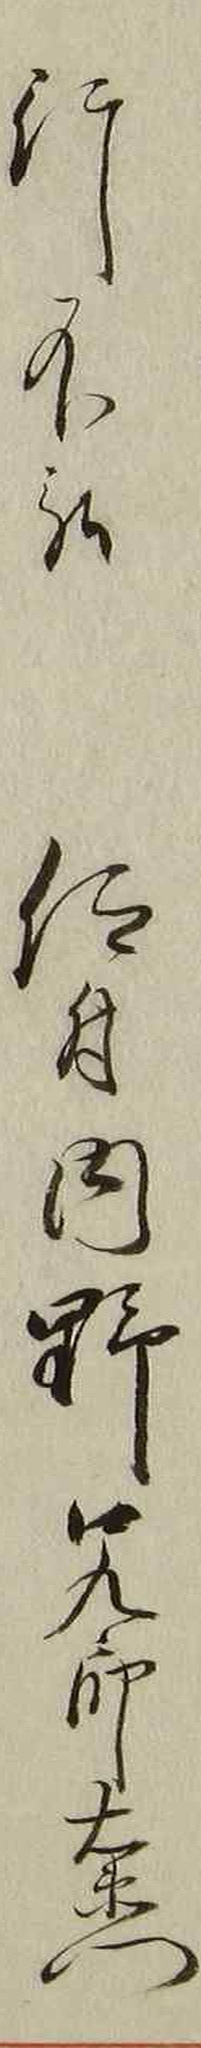行不被仰付内野郎右衛門
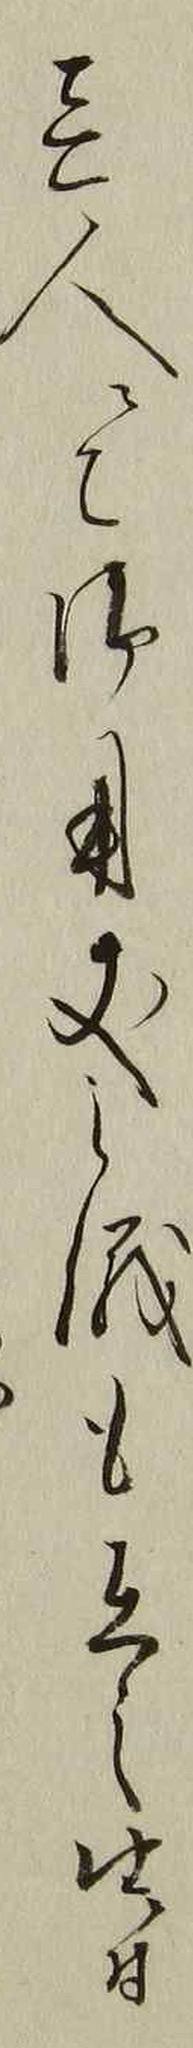壱人ニて御用丈之儀も有之由ニ付
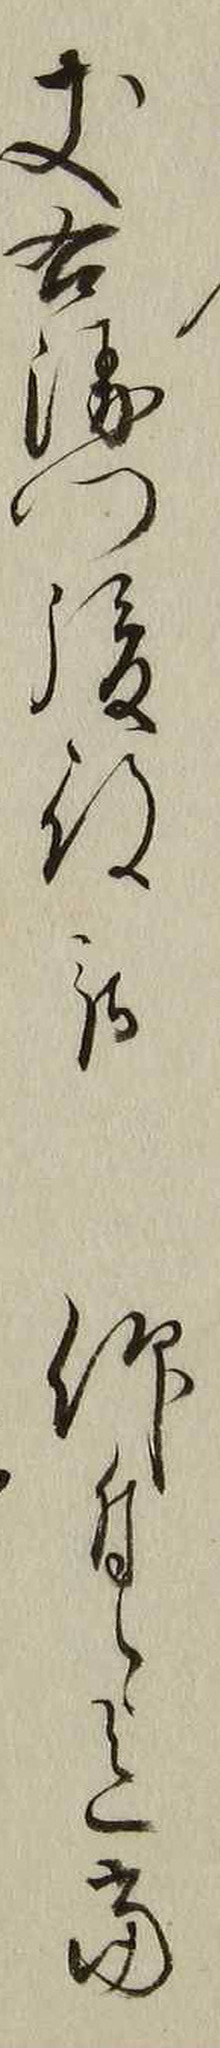丈右衛門後役被仰付候迄当
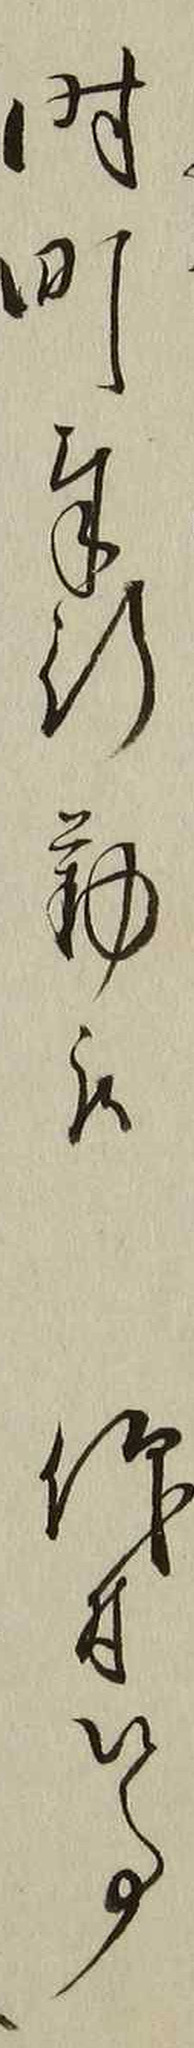時町奉行勤被仰付候事
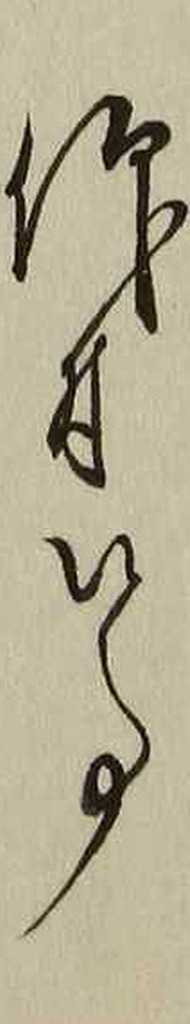仰付候事
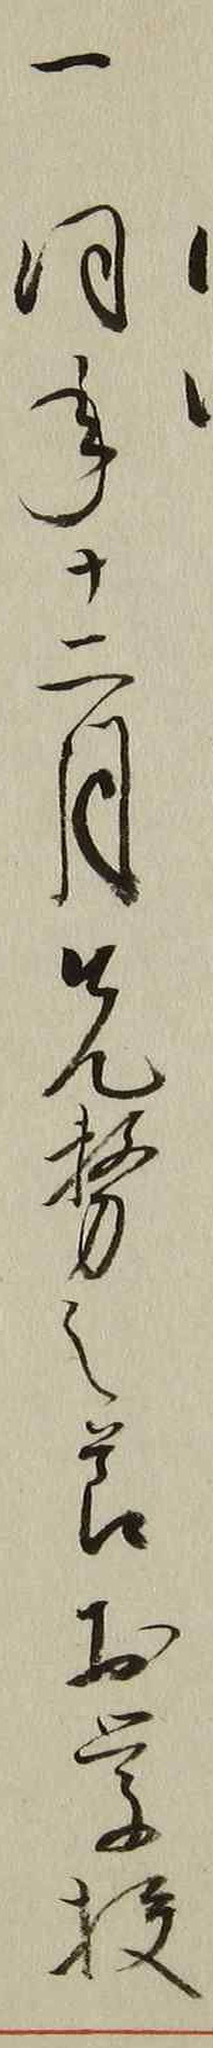一同年十二月先務之節於学校
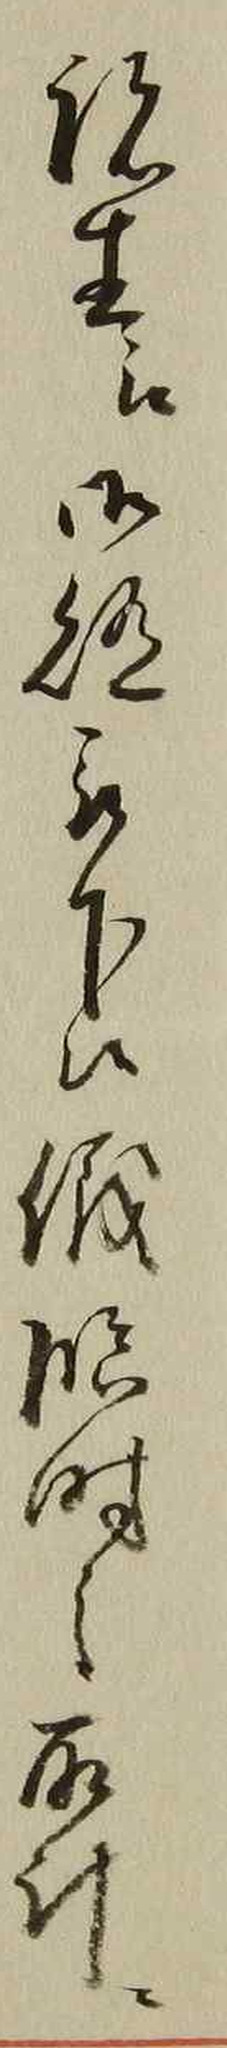諸生江御賄被下候儀臨時之取計ニ
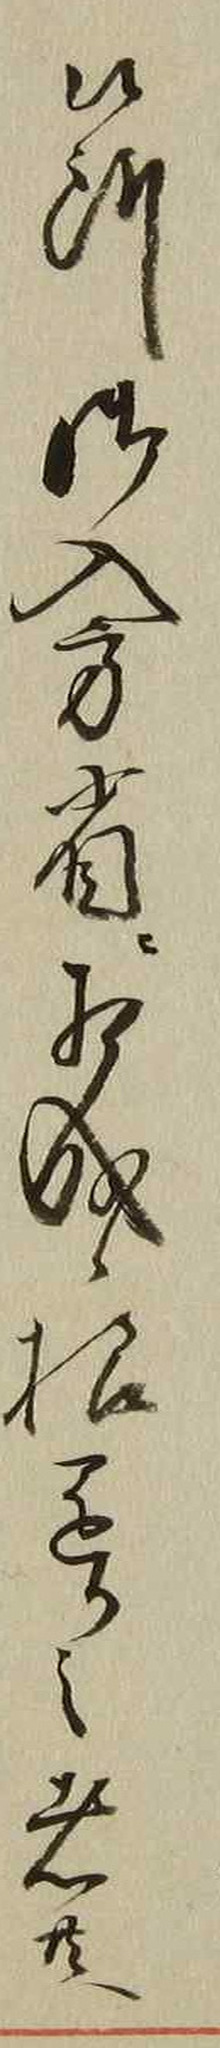候所御入方省ニ相成候様懸り之者共へ
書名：諸士系譜　巻之2　い之部2
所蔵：会津若松市立会津図書館
